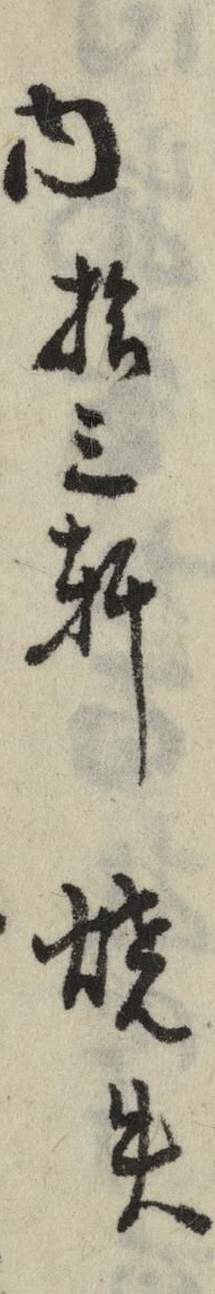内拾三軒焼失
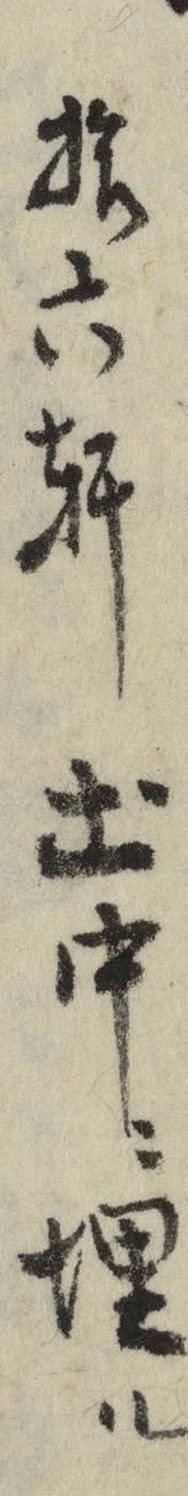拾六軒土中ニ埋ル
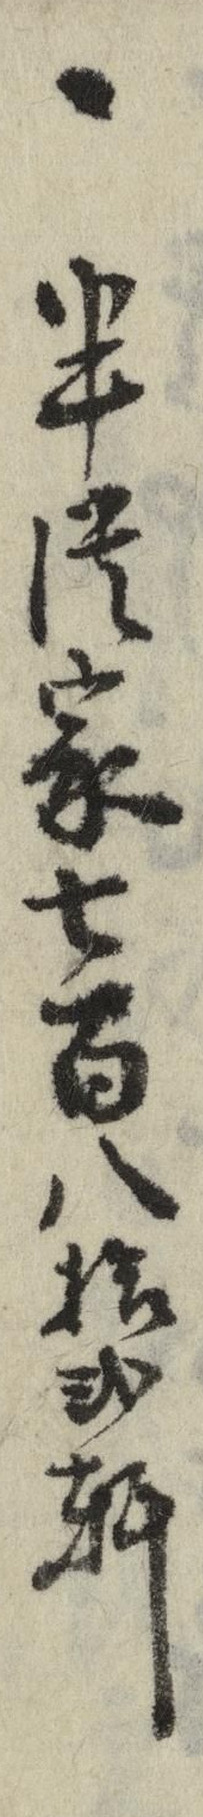一半潰家七百八拾弐軒
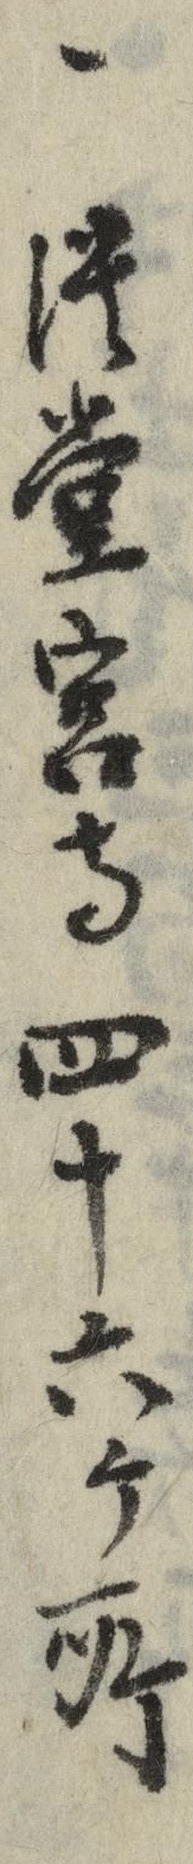一潰堂宮寺四十六ヶ所

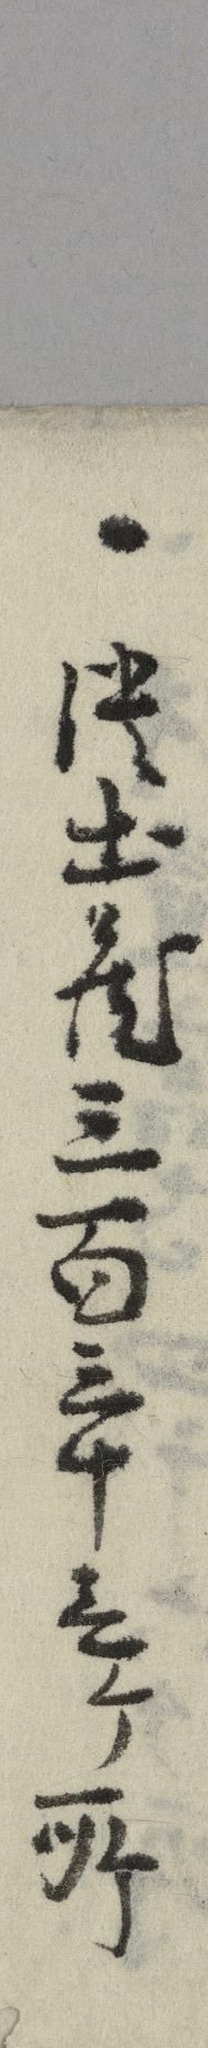一潰土蔵三百三十壱ヶ所
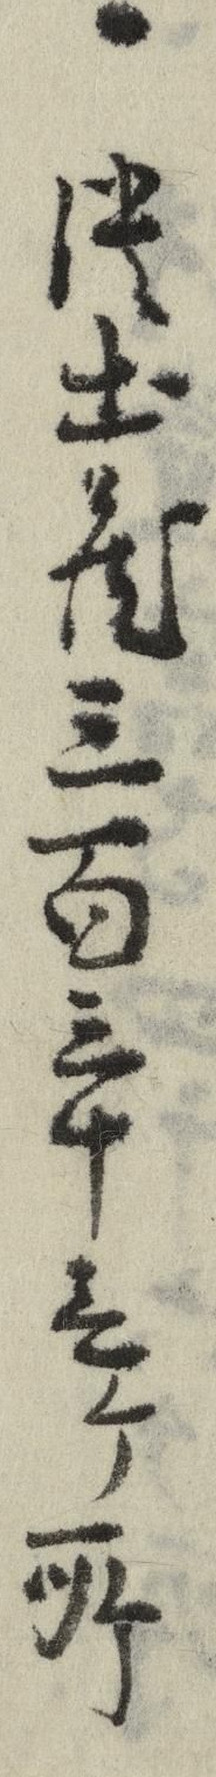一潰土蔵三百三十壱ヶ所
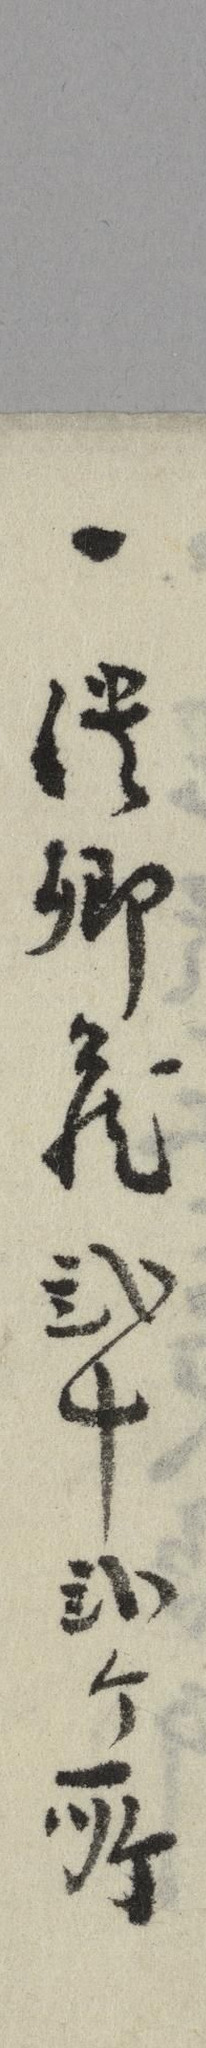一潰郷蔵弐十弐ヶ所
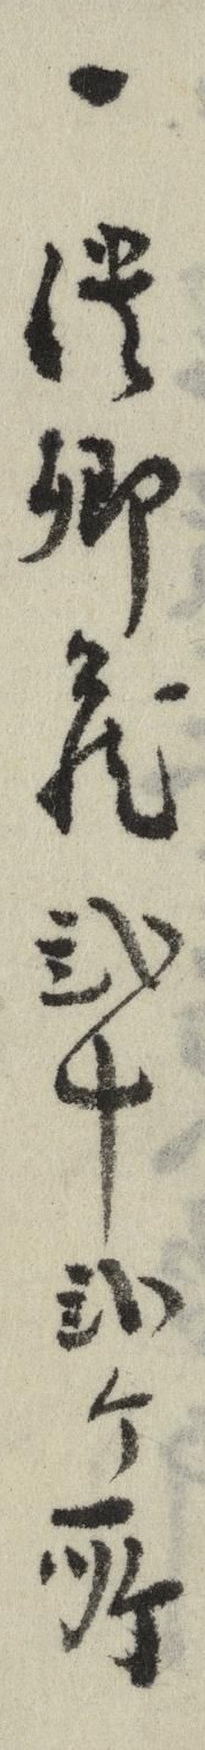一潰郷蔵弐十弐ヶ所
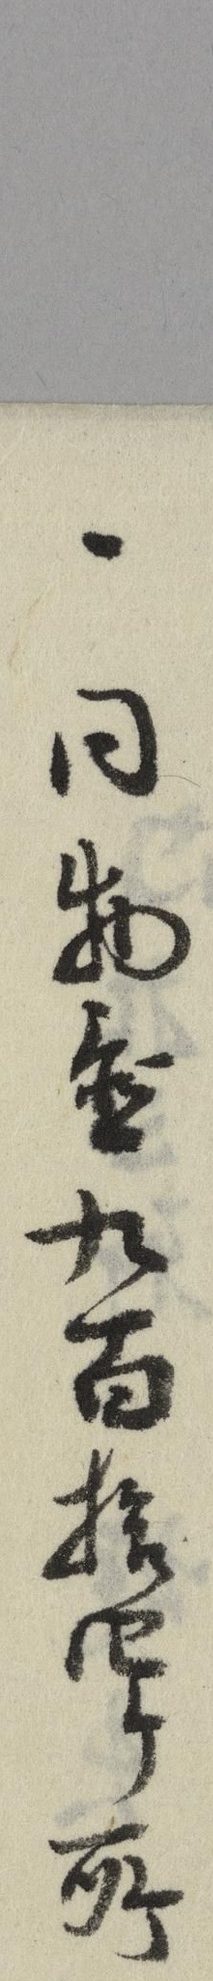一同物置九百拾四ヶ所
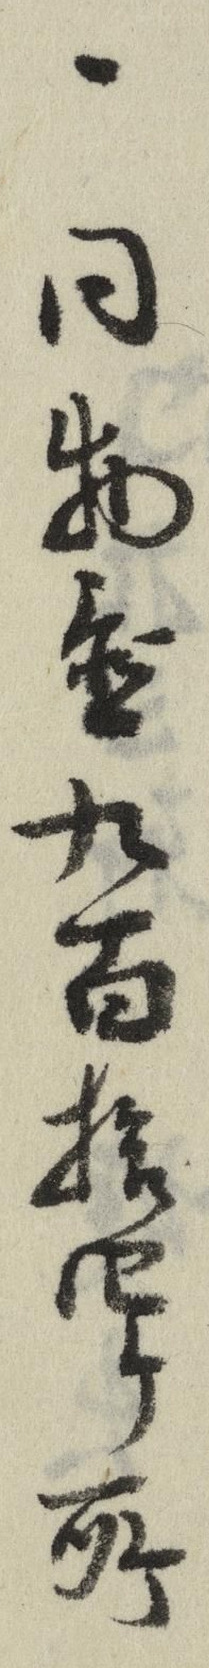一同物置九百拾四ヶ所
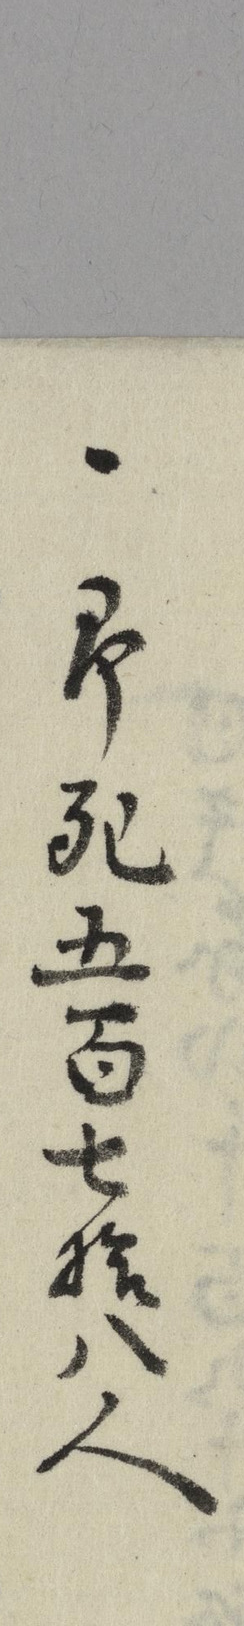一即死五百七拾八人
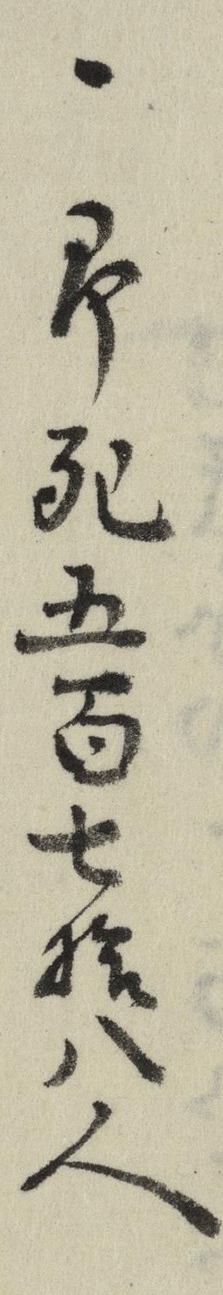一即死五百七拾八人
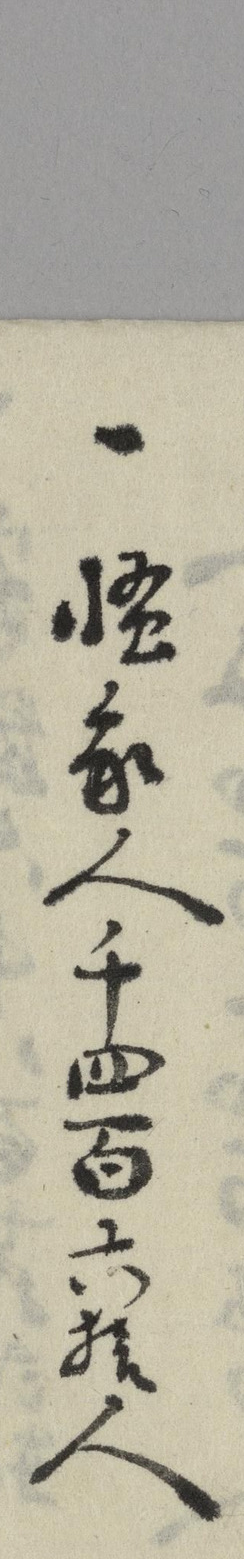一怪我人千四百六拾人
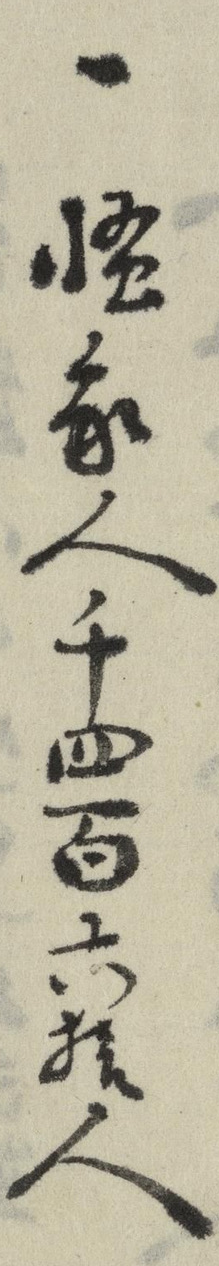一怪我人千四百六拾人
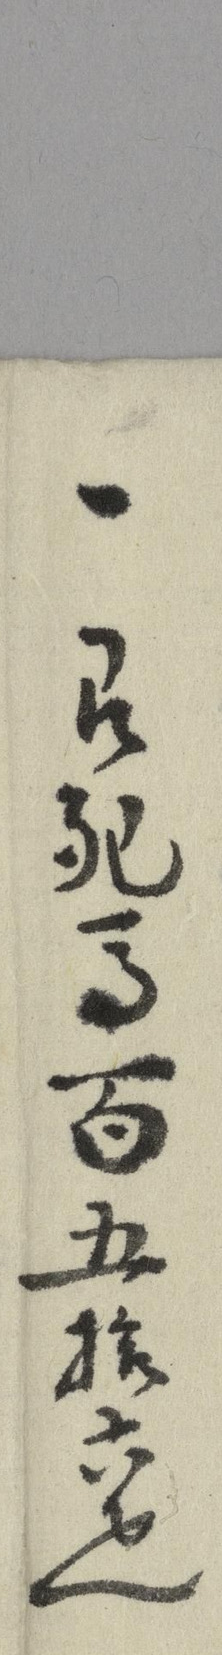一即死馬百五拾六疋
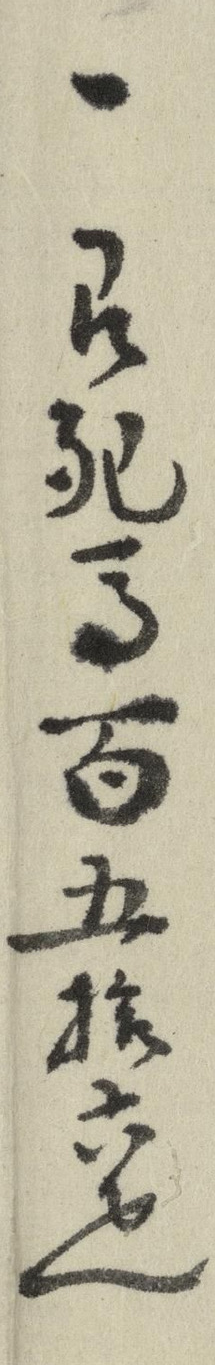一即死馬百五拾六疋
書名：信州大地震一件之冩　丁未弘化四年三月吉日
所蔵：東京大学地震研究所図書室 Earthquake Research Institute Library, The University of Tokyo, JAPAN
